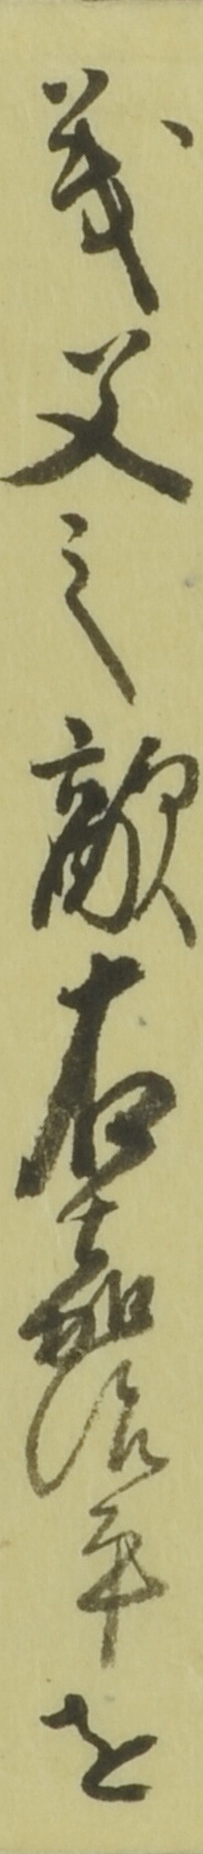義父之敵右嘉治平を
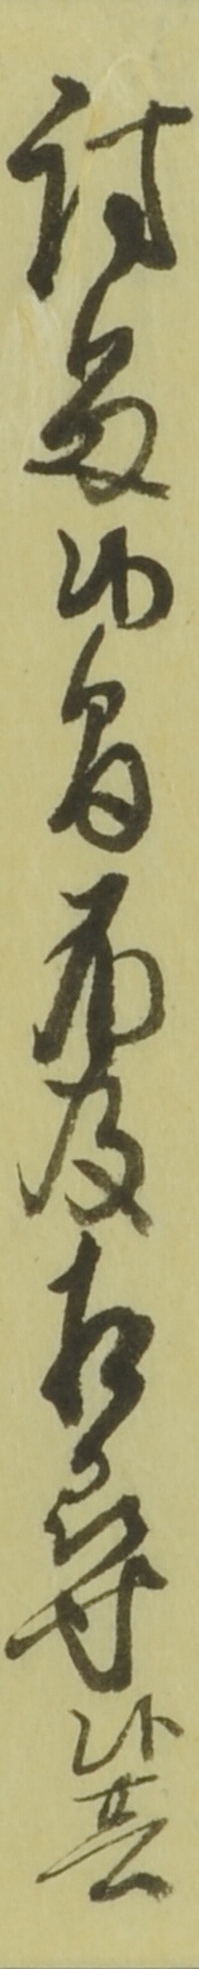討留候間不及相尋候共
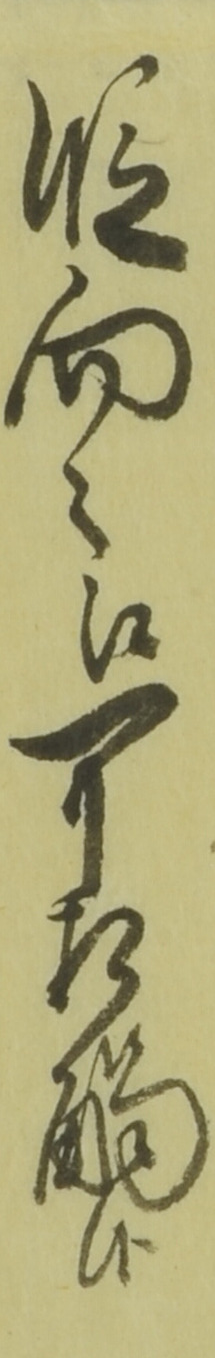段向々江可相触候
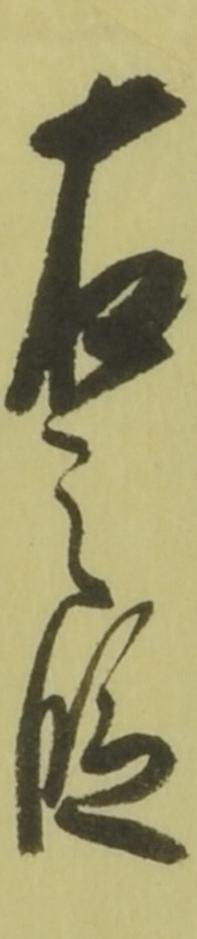右之段
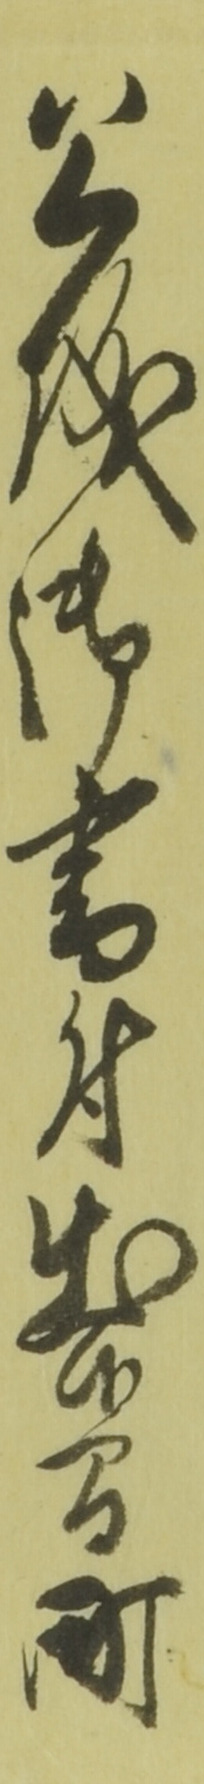公儀御書付出候間町
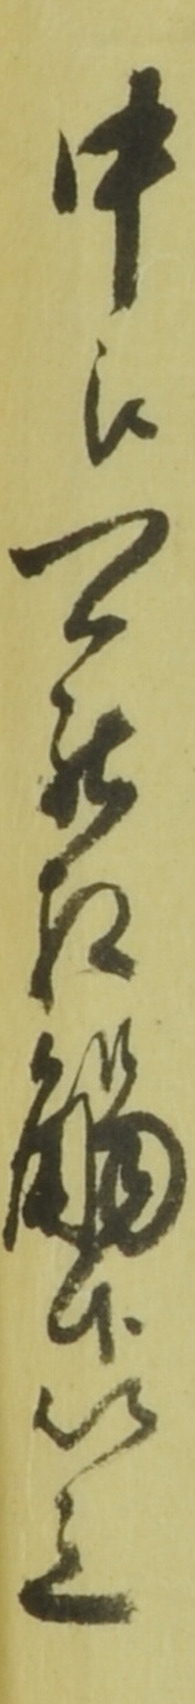中江可被相触候以上
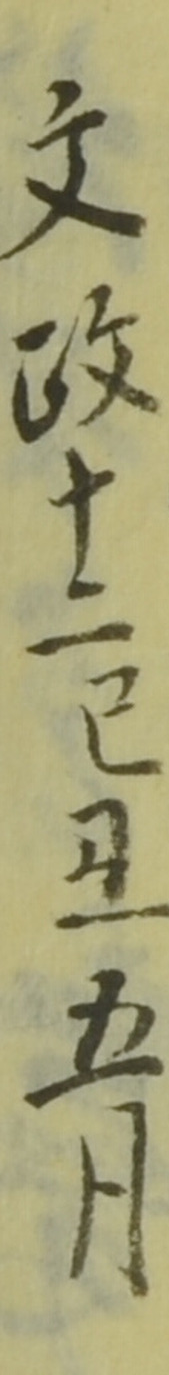文政十二己丑五月
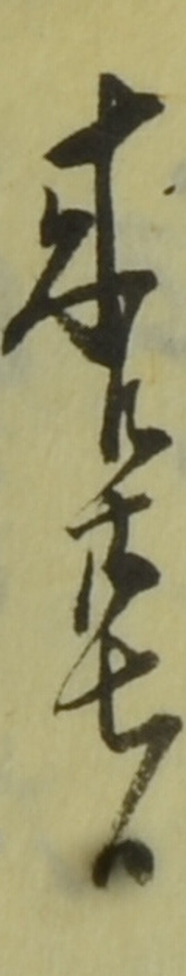来ル廿七日
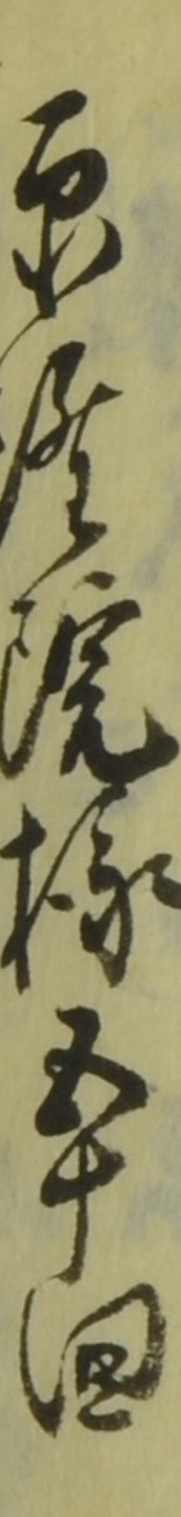源隆院様五十回

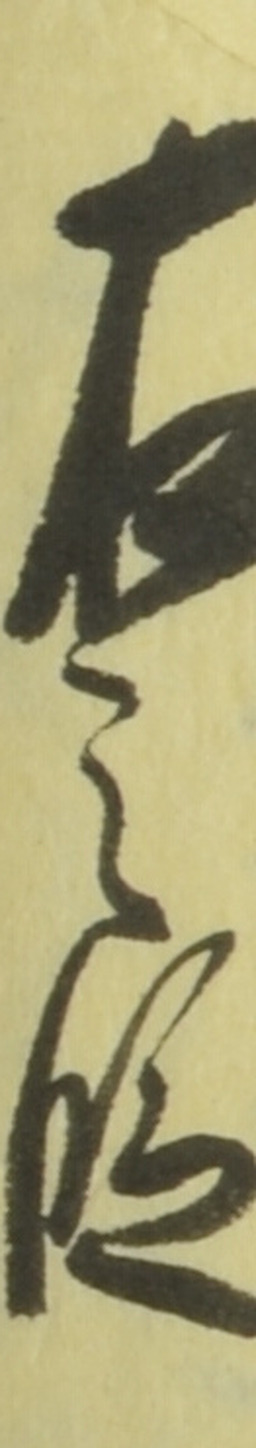右之段
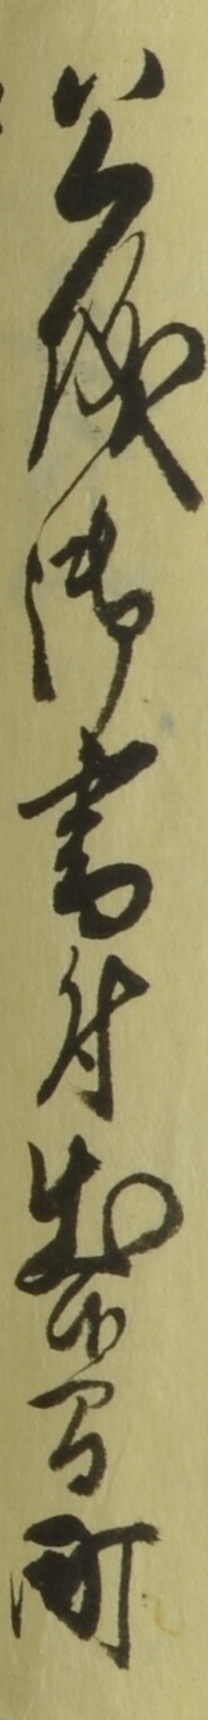公儀御書付出候間町
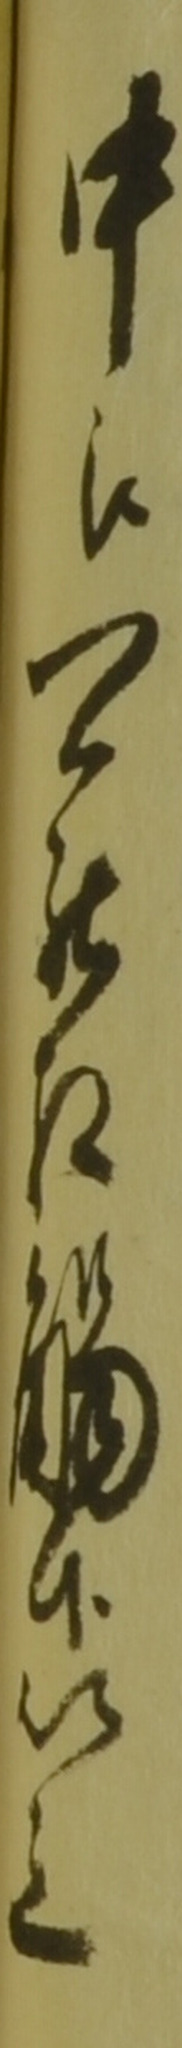中江可被相触候以上
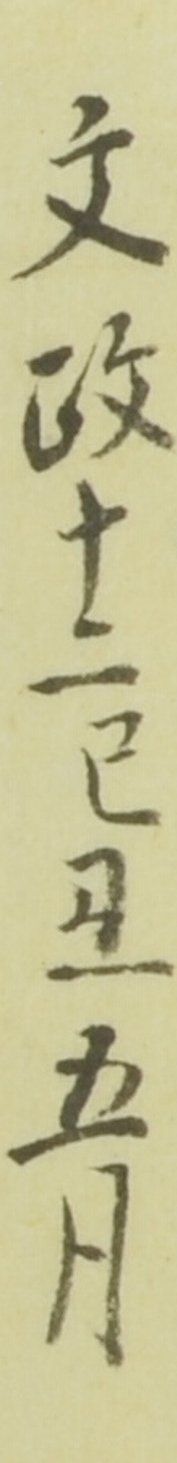文政十二己丑五月
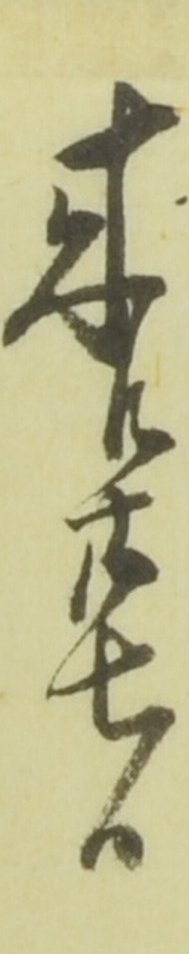来ル廿七日
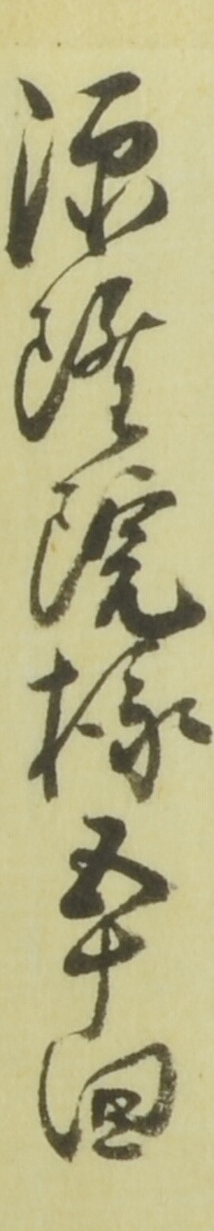源隆院様五十回
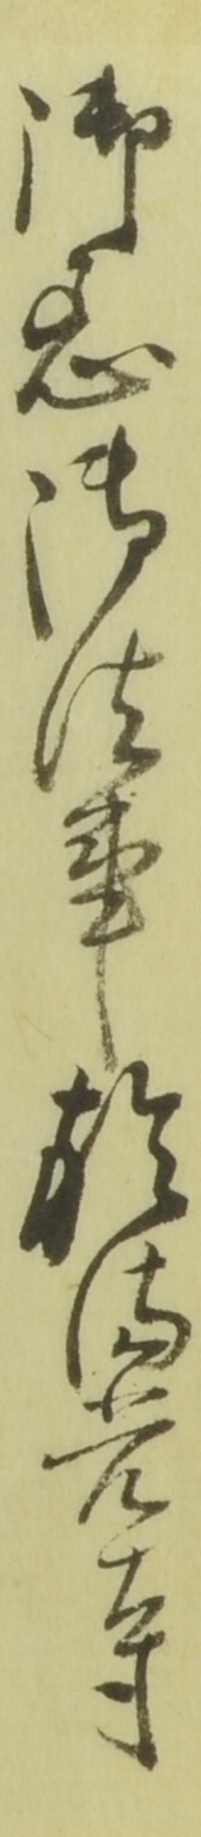御忌御法事御満光寺
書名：御触書御書附控
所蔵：伊那市立高遠町図書館・合同会社AMANE
